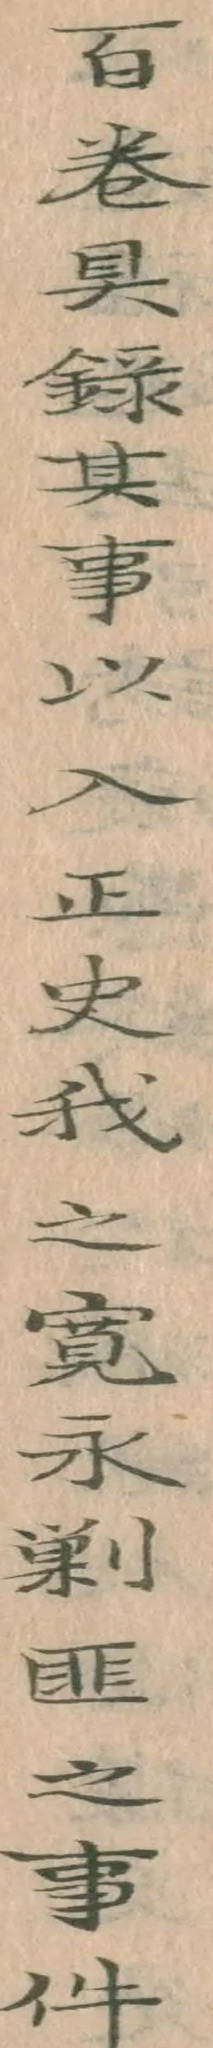百巻具録其事以入正史我之寛永剿匪之事件
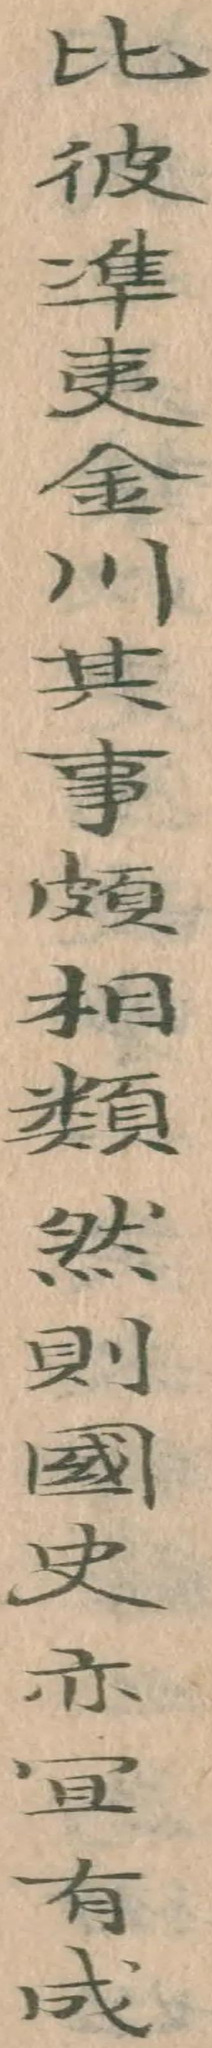比彼準夷金川其事頗相類然則国史亦宜有成
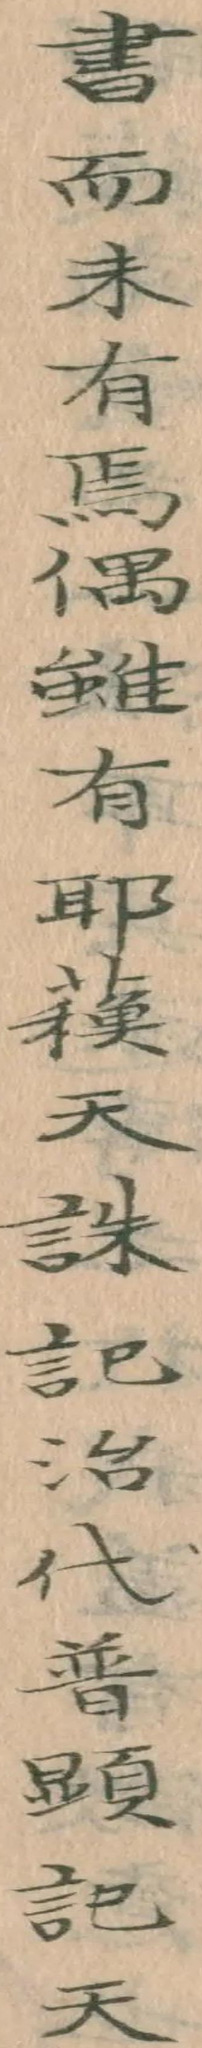書而未有焉偶雖有耶蘇天誅記治代普顕記天
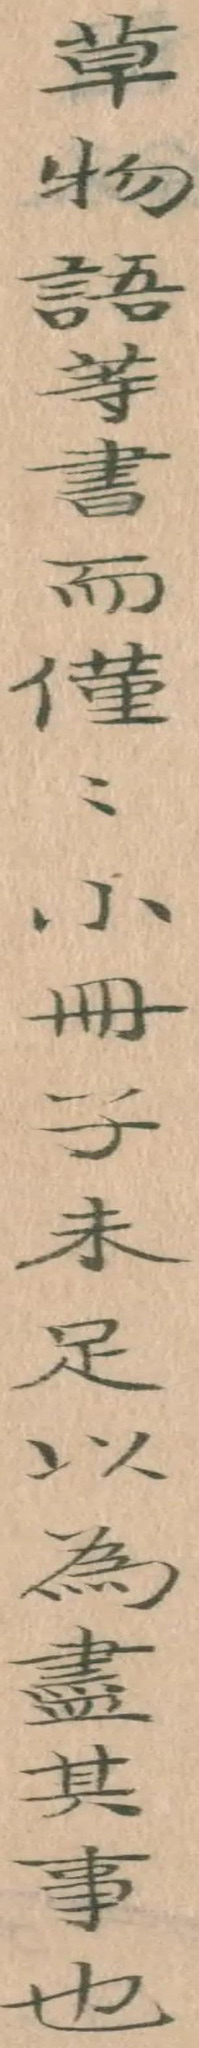草物語等書而僅々小冊子未足以為尽其事也
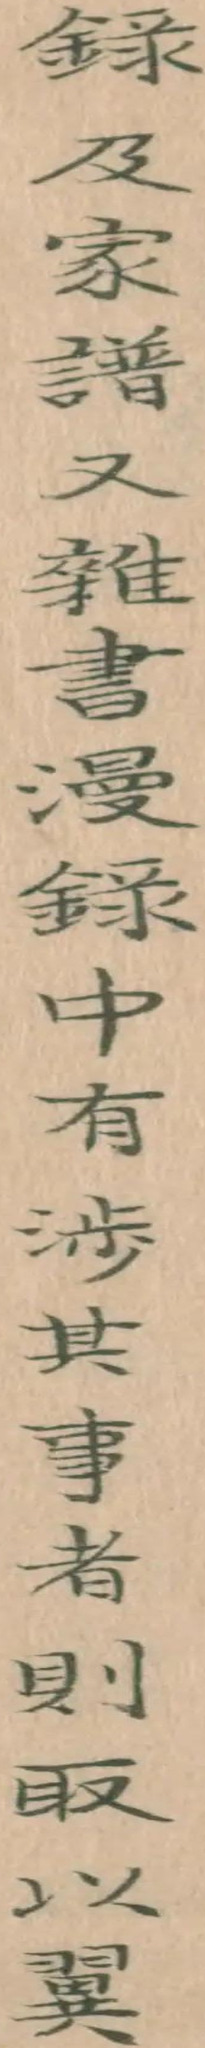録及家譜又雑書漫録中有渉其事者則取以翼
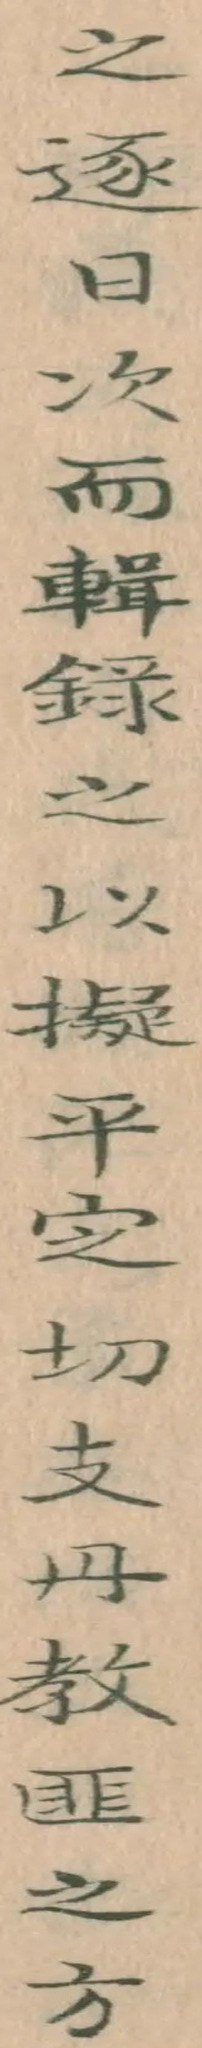之逐日次而輯録之以擬平定切支丹教匪之方
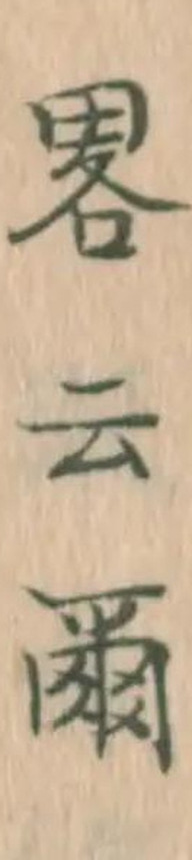略云爾
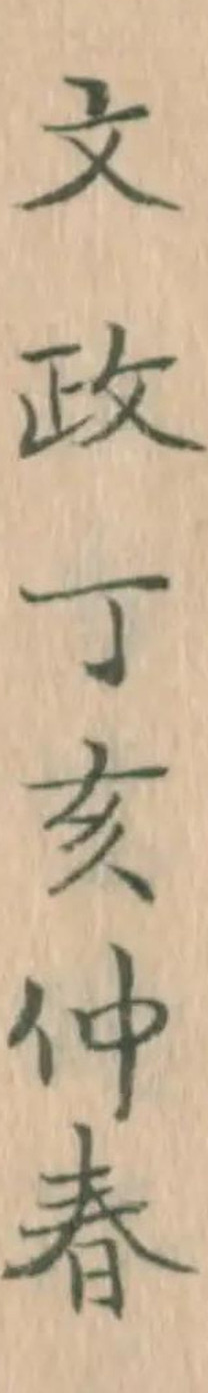文政丁亥仲春

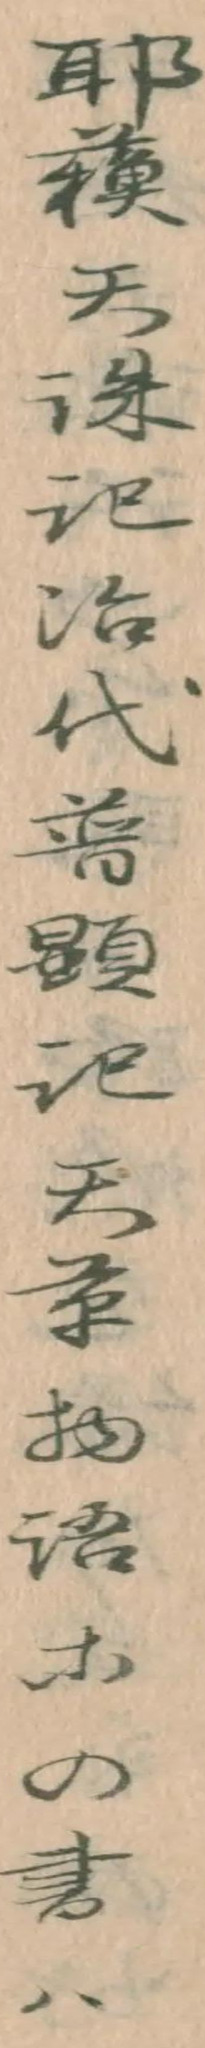一耶蘇天誅記治代普顕記天草物語等の書は
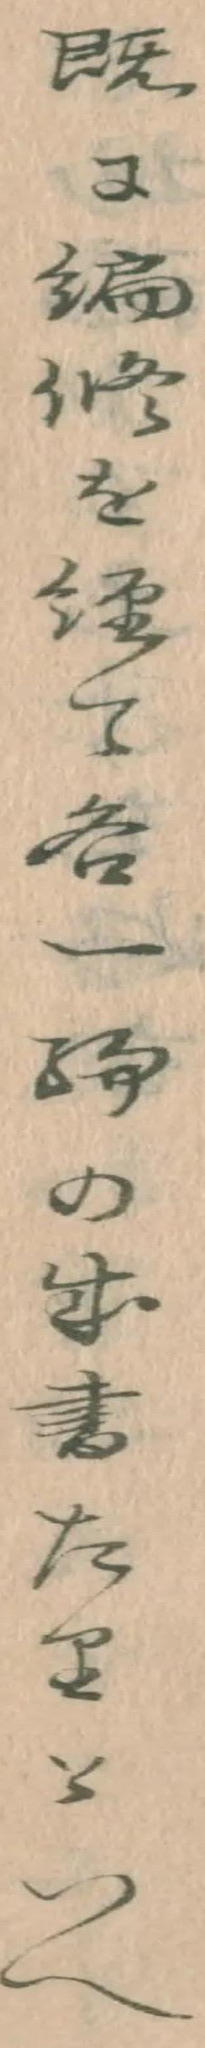既に編修を経て各一編の成書たりといへ
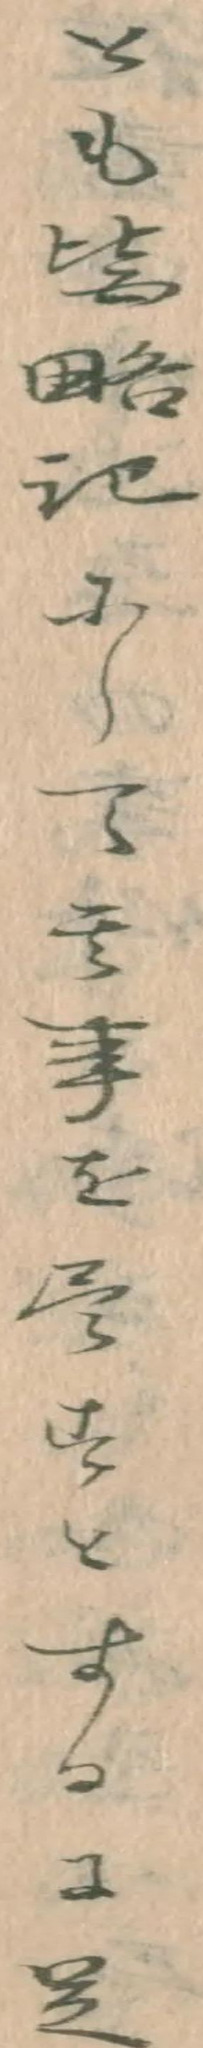とも皆略記にして其事を尽すとするに足
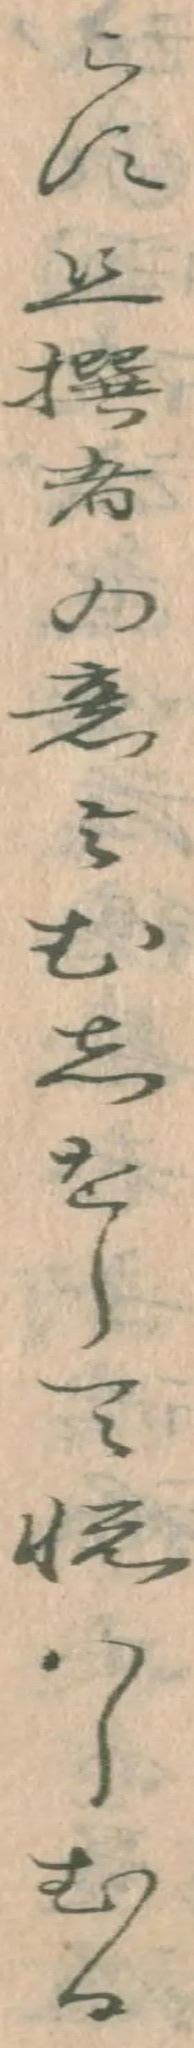らす且撰者の意よむ者をして悦はしむる
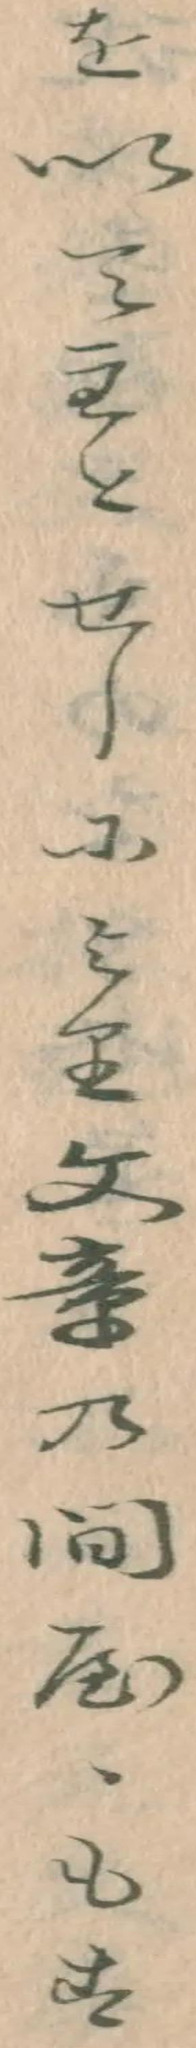を以て主とせしにより文章の間やゝもす
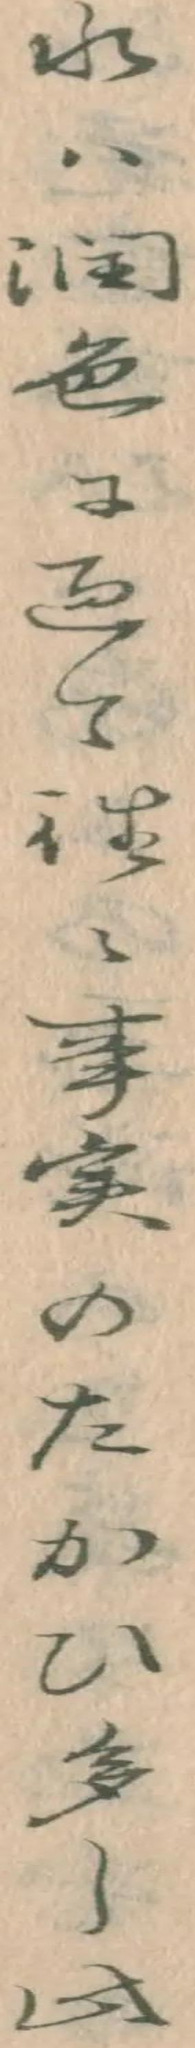れは潤色に過て往々事実のたかひ多し此
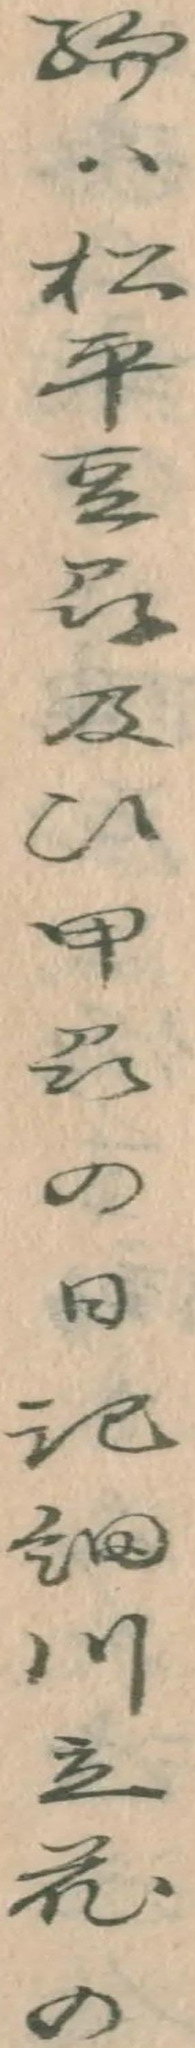編は松平豆州及ひ甲州の日記細川立花の
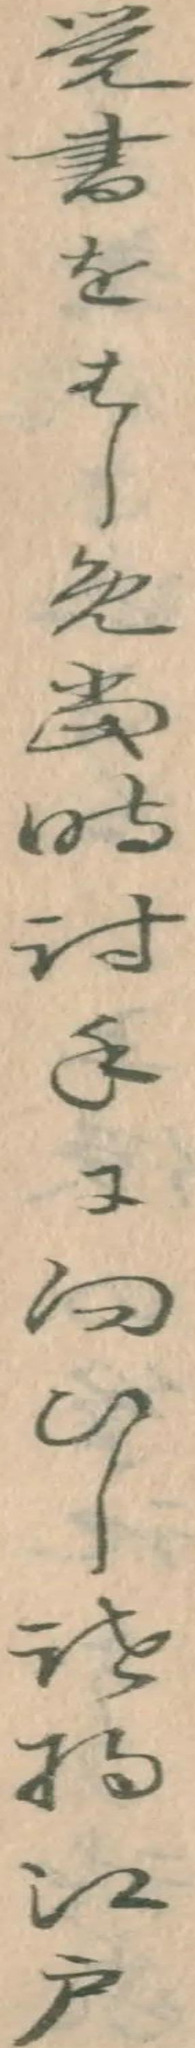覚書をはしめ当時討手に向ひし諸将江戸
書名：切支丹御退治記 49巻. [1]
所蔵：国立国会図書館 National Diet Library, JAPAN
